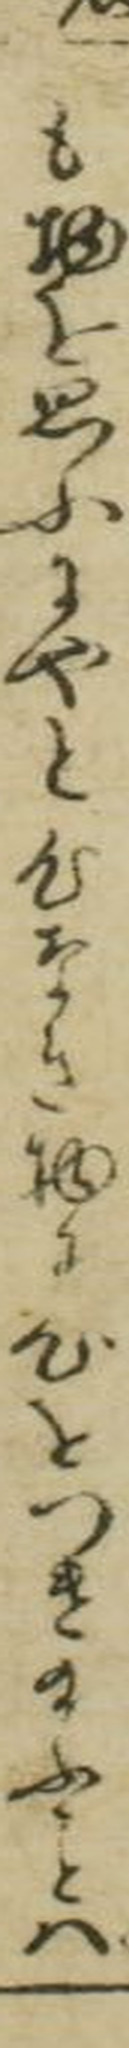も物を思ふにやと心なき物に心をつけ給ふことは。
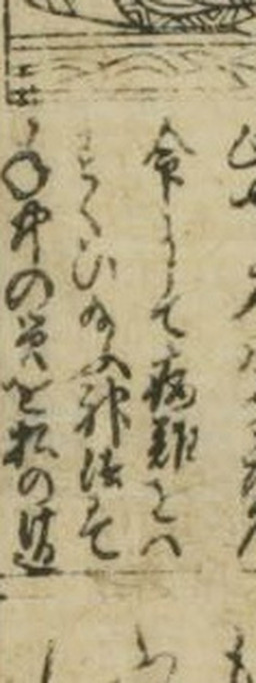すくひ給ふ神法にて
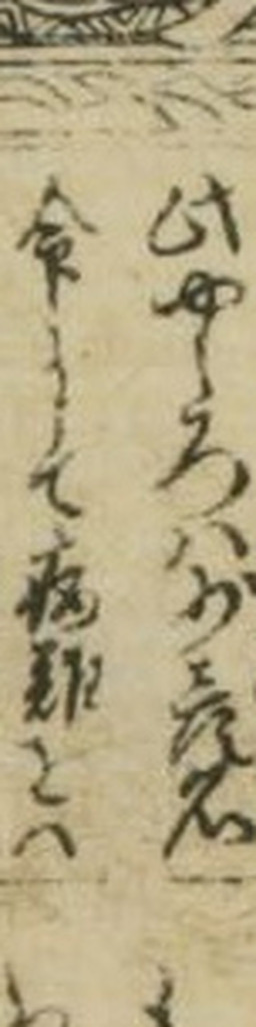命にして病難をは
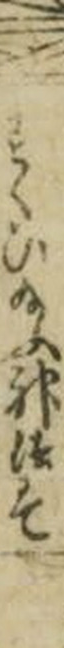すくひ給ふ神法にて
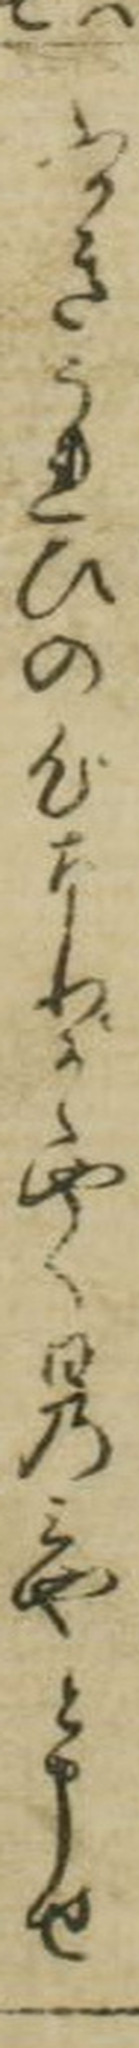ふかきうれひの心なり。かゝやく日のみやと申せ
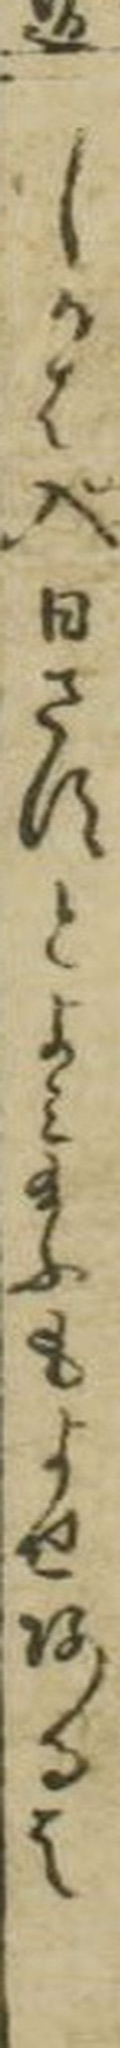しかは。入日さすとよみ給ふもよせある也
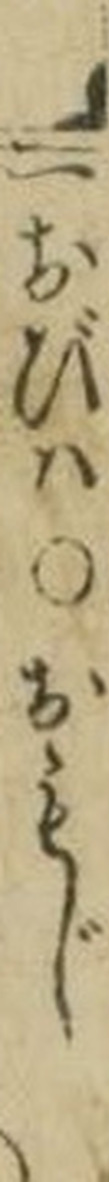一おびは○おもじ
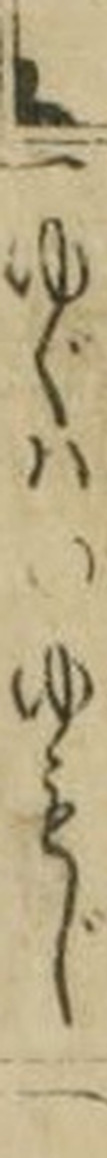一ゆぐは○ゆもじ
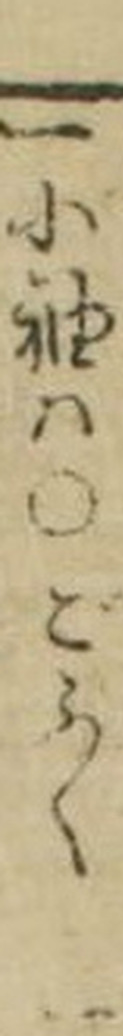一小袖は○ごふく
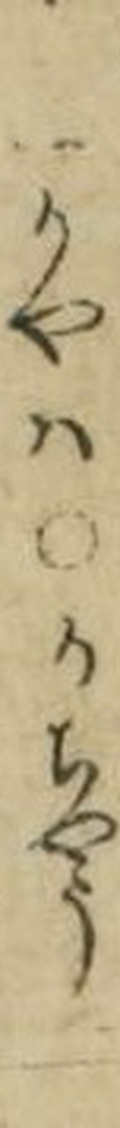一かやは○かちやう
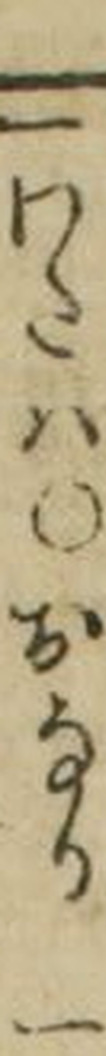一わたは○おなか
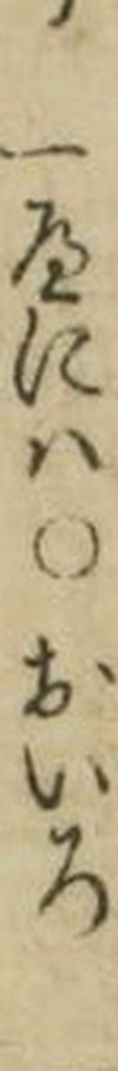一へには○おいろ
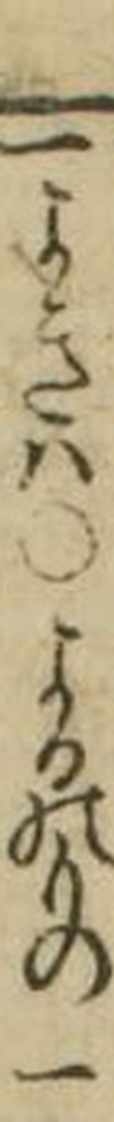一よきは○よるのもの
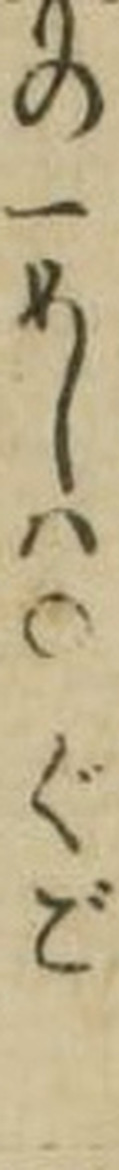一めしは○ぐご
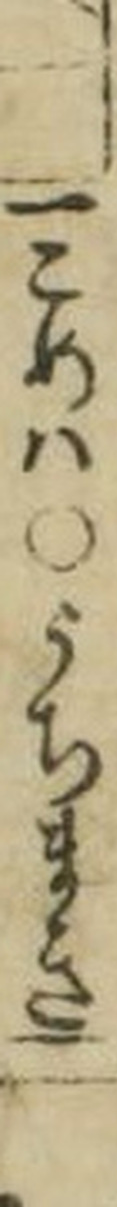一こめは○うちまき
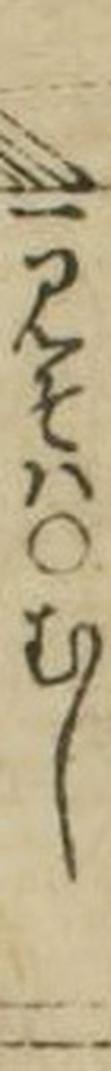一みそは○むし
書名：女源氏教訓鑑
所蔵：東京学芸大学附属図書館
